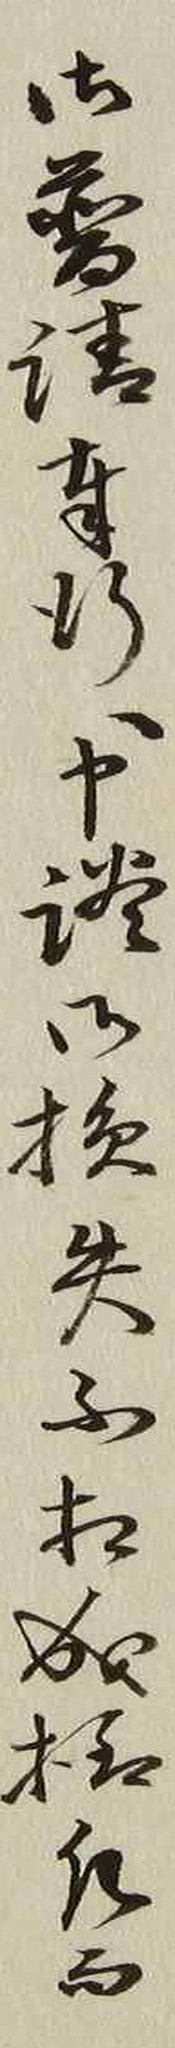御普請奉行へ申談御損失不相成様凡而
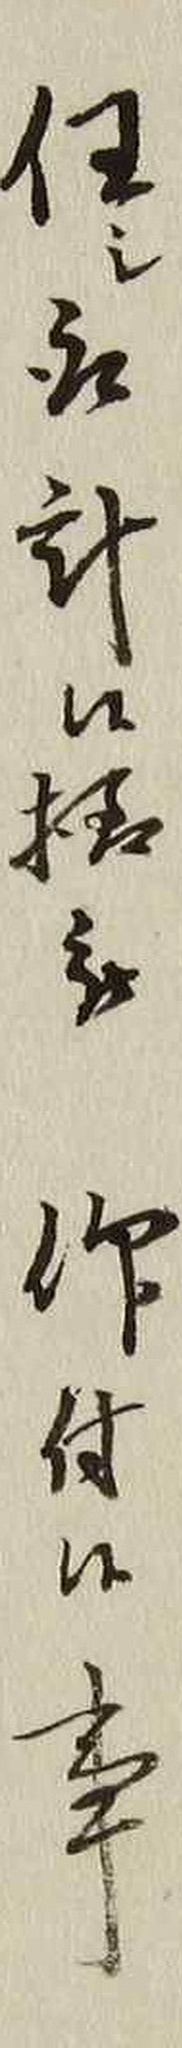任シ取計候様被仰付候事
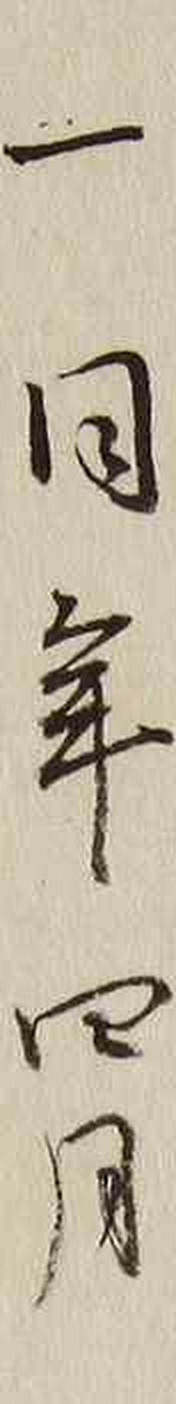一同年四月
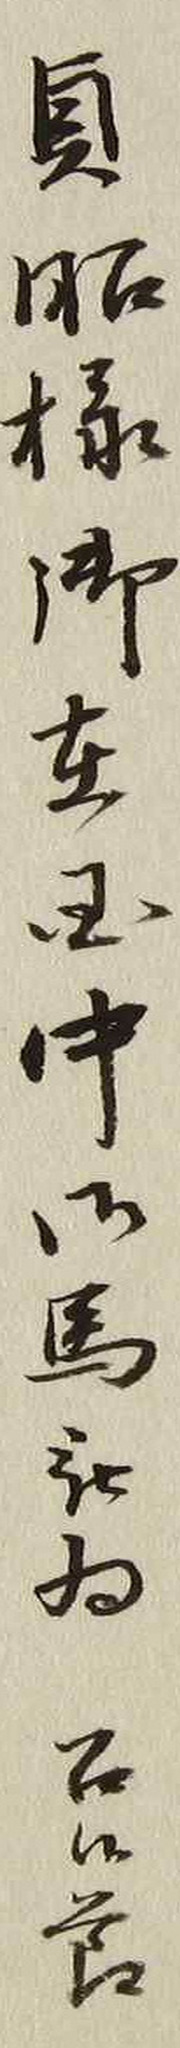貞昭様御在国中御馬被為召候節
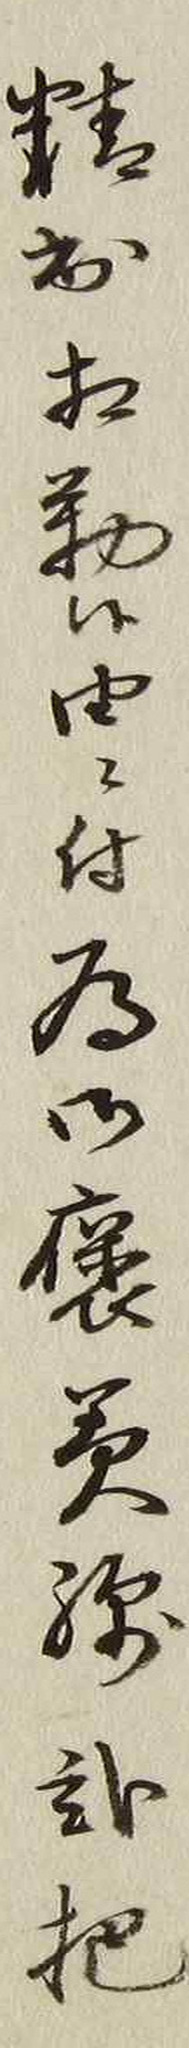精出相勤候由ニ付為御褒美綿弐把
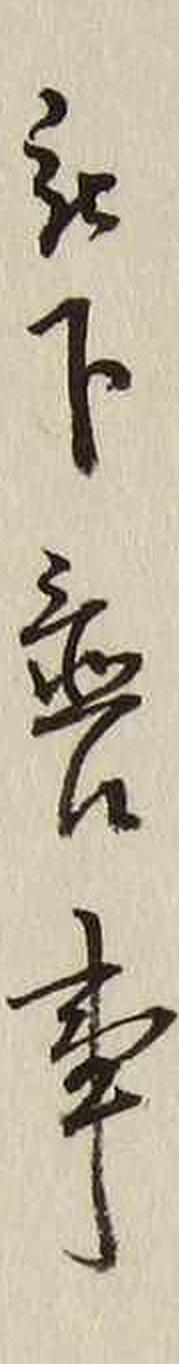被下置候事
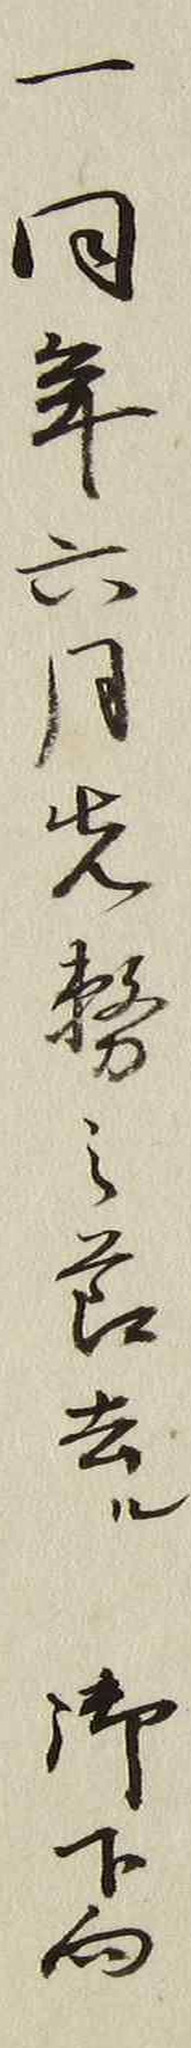一同年六月先務之節去ル御下向
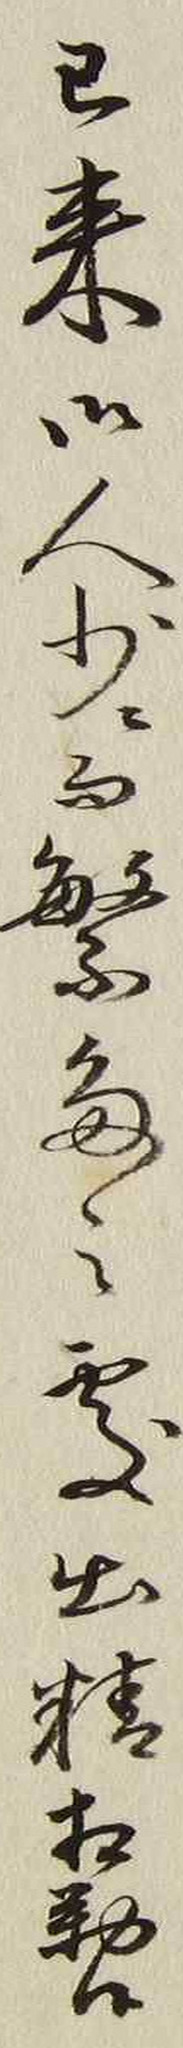已来御人少ニ而繁多之処出精相勤候
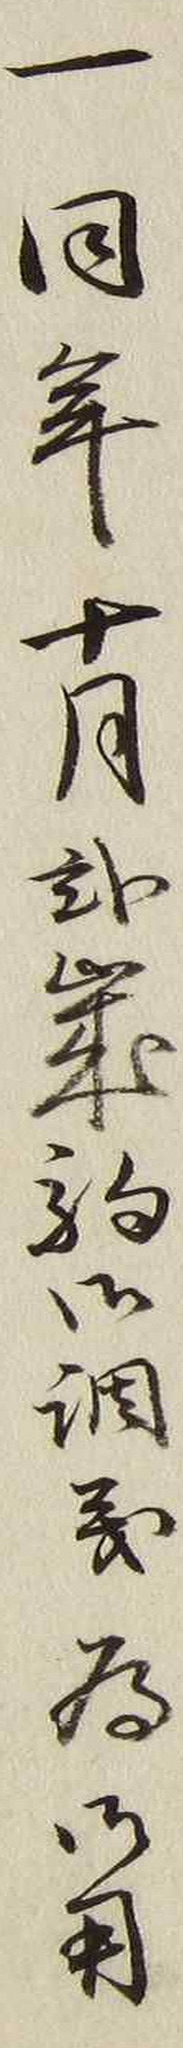一同年十月弐歳駒御調義為御用

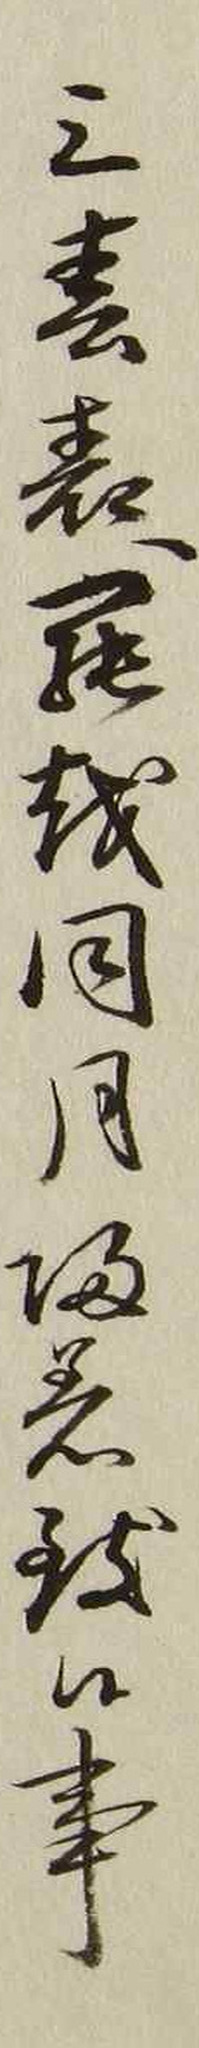三春表へ罷越同月帰着致候事
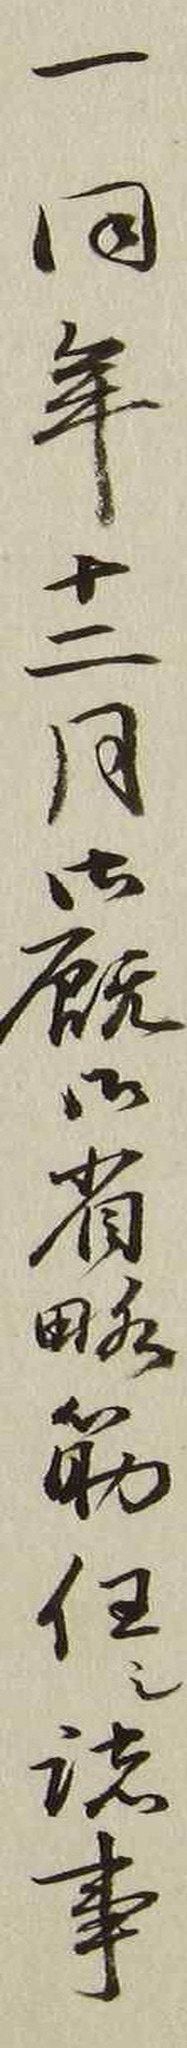一同年十二月御厩御省略筋任シ諸事
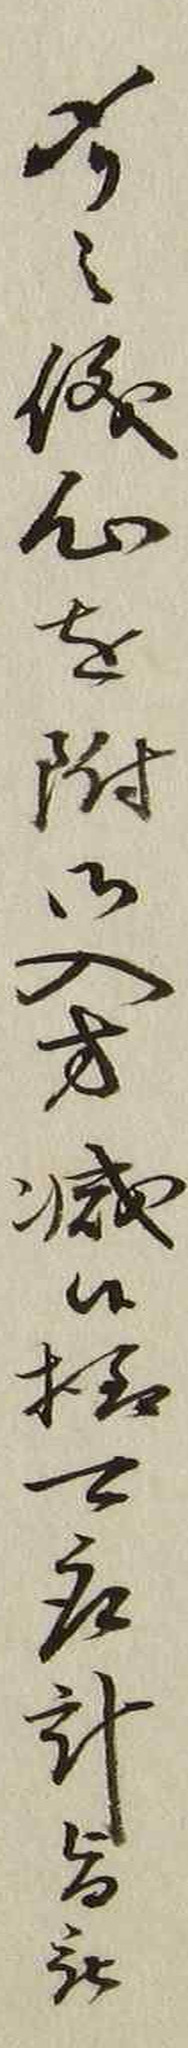〆り之儀心を附御入方減候様可取計旨被
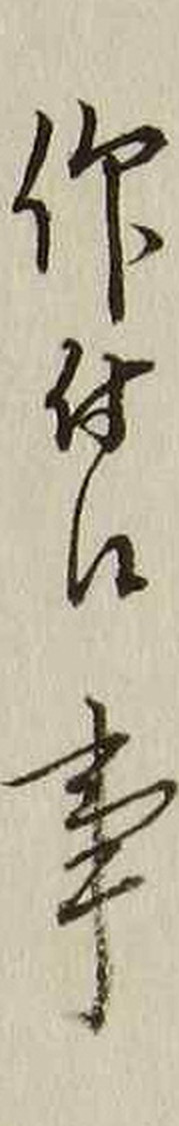仰付候事
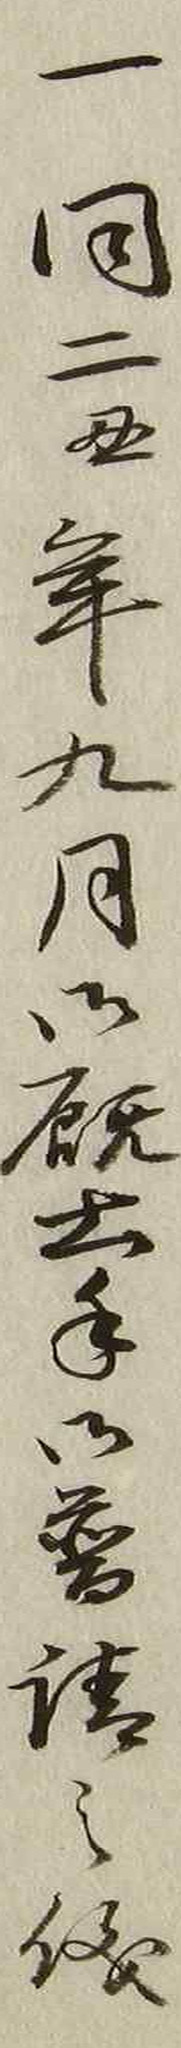一同二丑年九月御厩土手御普請之儀
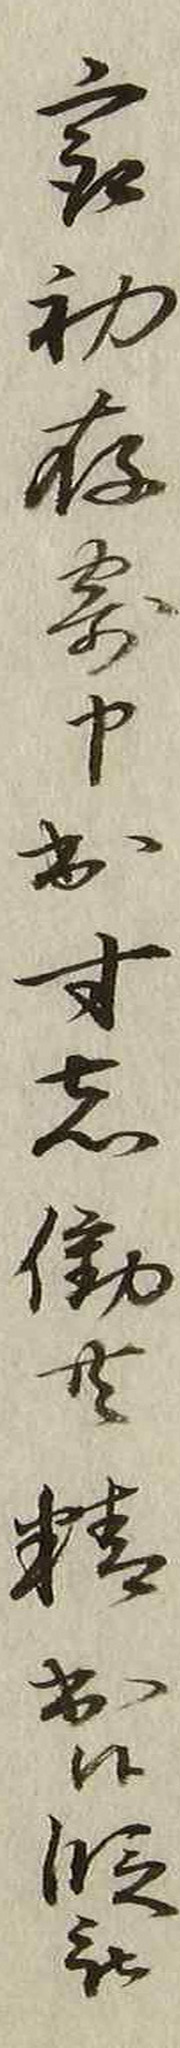最初存寄申出寸志働共精出候段被
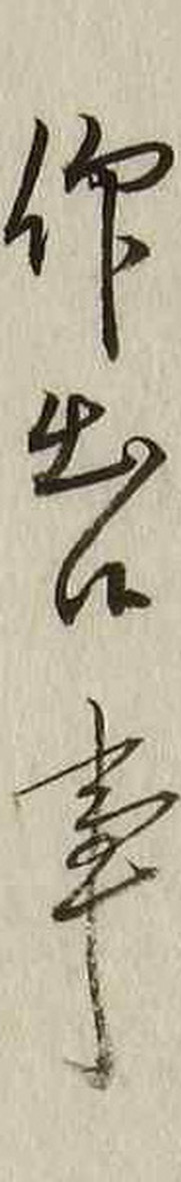仰出候事
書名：諸士系譜　巻之160　な之部2
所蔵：会津若松市立会津図書館
